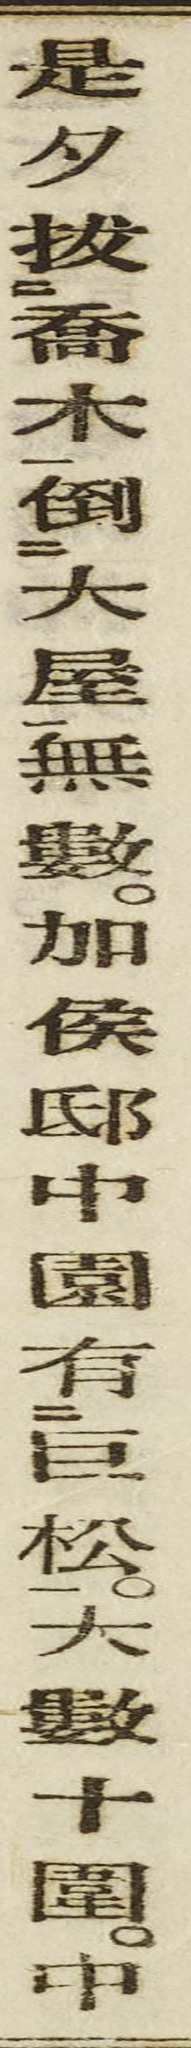是夕抜ニ喬木倒ニ大屋無数。加侯邸中園有ニ巨松。大数十囲。中
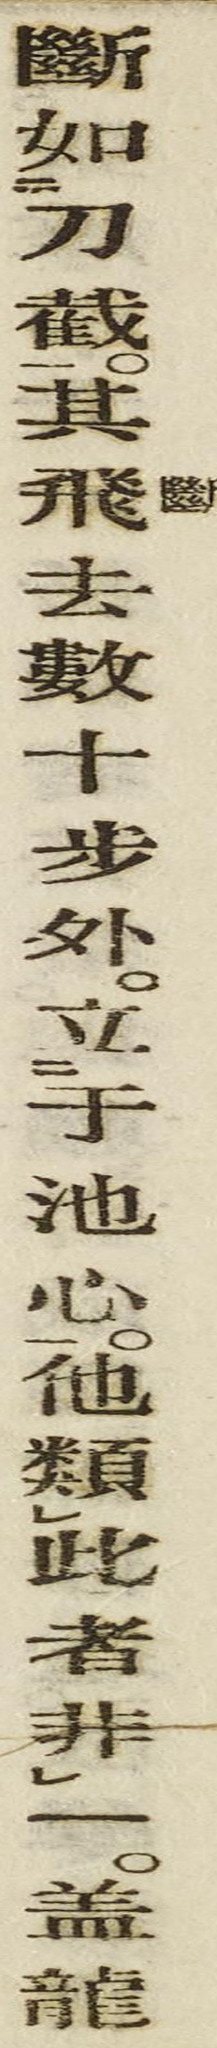断如ニ刀截。其飛去数十歩外。立ニ于池心。他類此者非一。盖龍
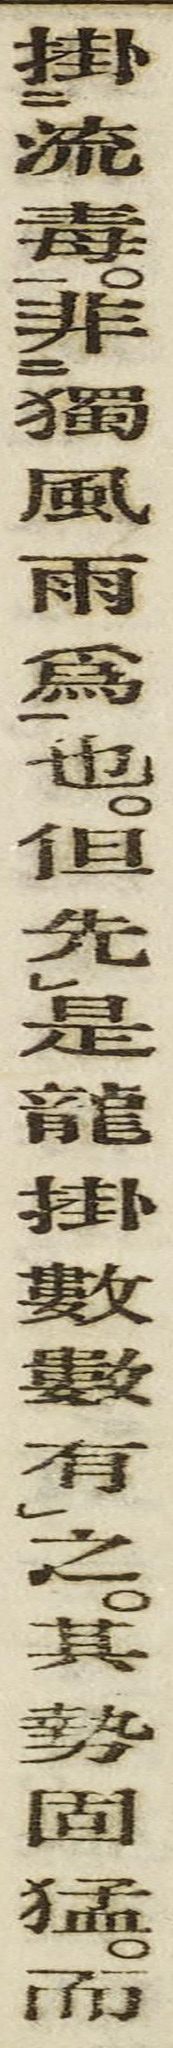掛ニ流毒。非ニ独風雨為也。但先是龍掛数数有之。其勢固猛。而
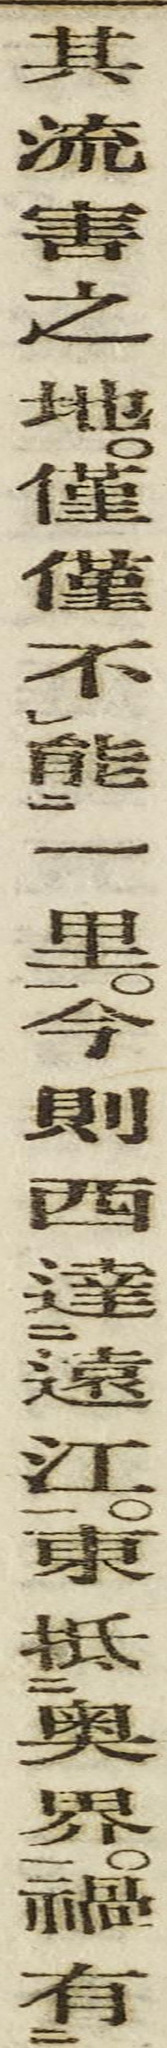其流害之地。僅僅不能ニ一里。今則西達ニ遠江。東抵ニ奥界。緺有ニ
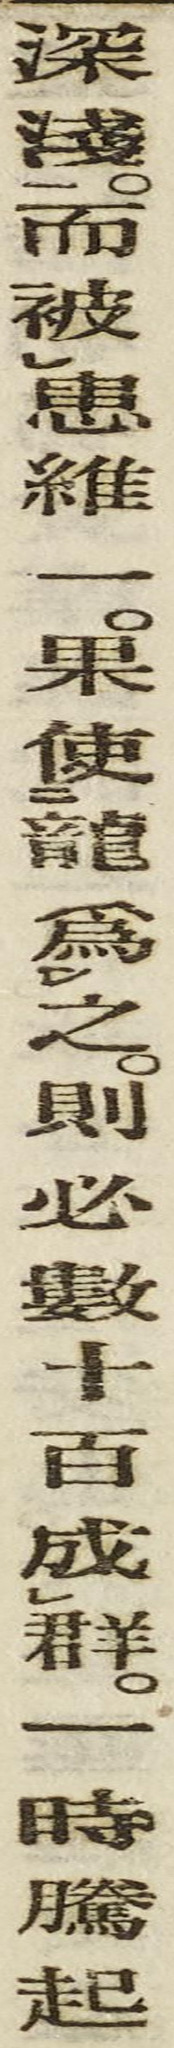深浅。而被患維一。果使ニ龍為レ之。則必数十百成群。一時騰起
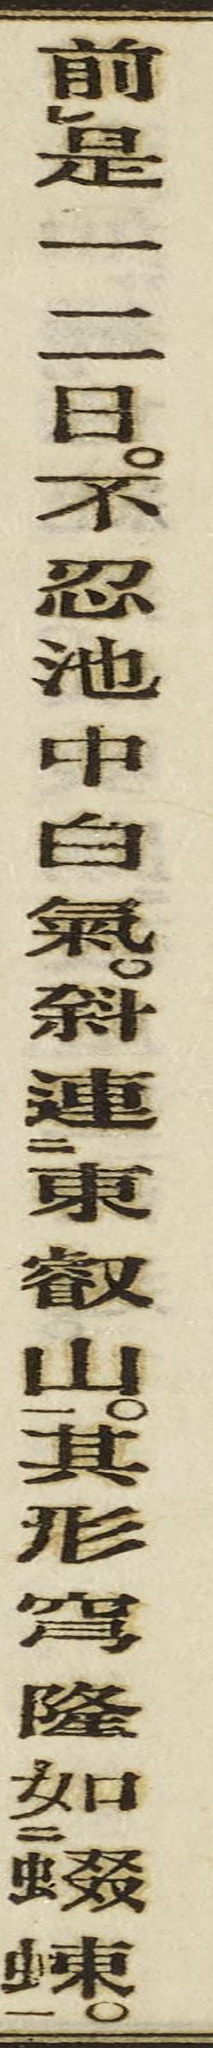前是一二日。不忍池中白気。斜連ニ東叡山。其形穹隆如ニ蝃蝀。
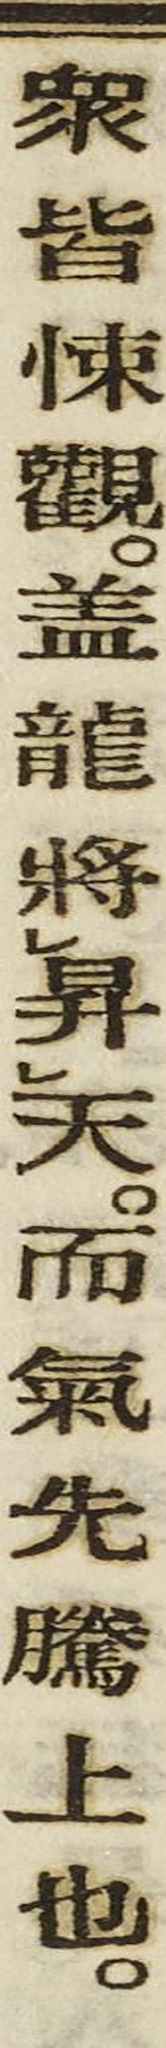衆皆悚観。盖龍将昇天。而気先騰上也。
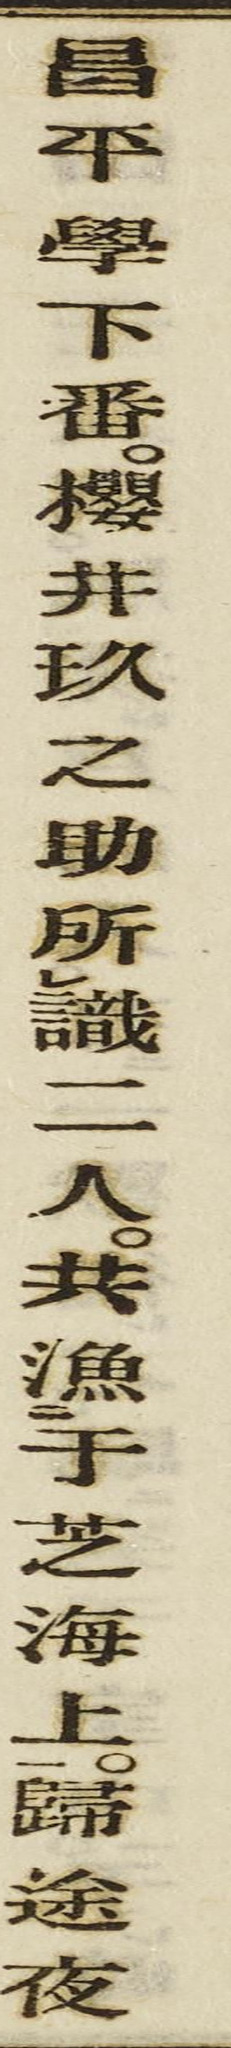昌平学下番。桜井玖之助所識二人。共漁ニ于芝海上。帰途夜
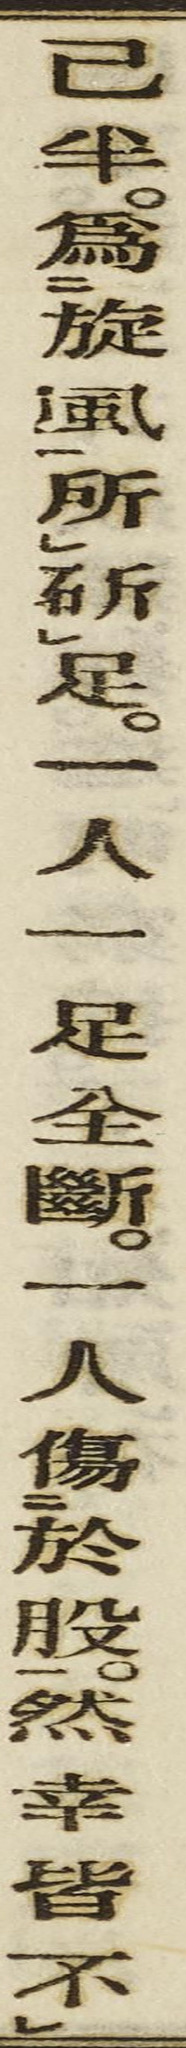己半。為ニ旋風所斫足。一人一足全断。一人傷ニ於股。然幸皆不
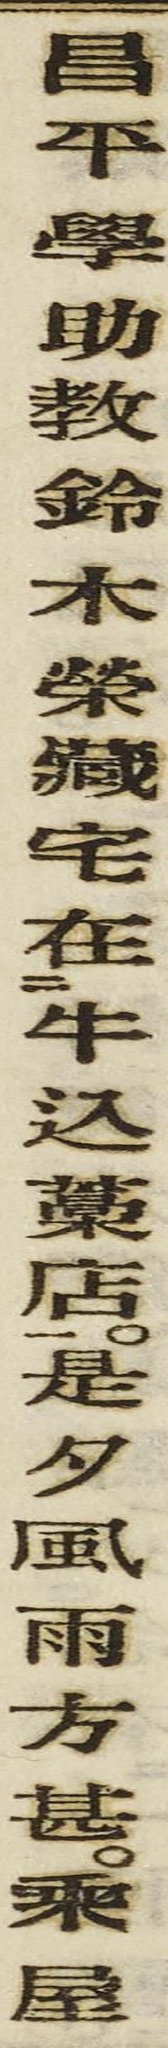昌平学助教鈴木栄蔵宅在ニ牛込藁店。是夕風雨方甚。乗屋
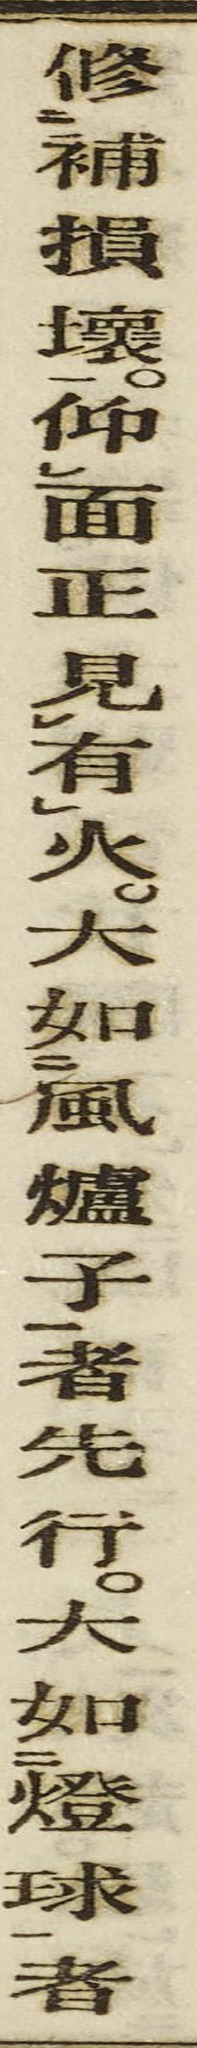修ニ補損壊。仰面正見有火。大如ニ風炉子者先行。大如ニ燈球者
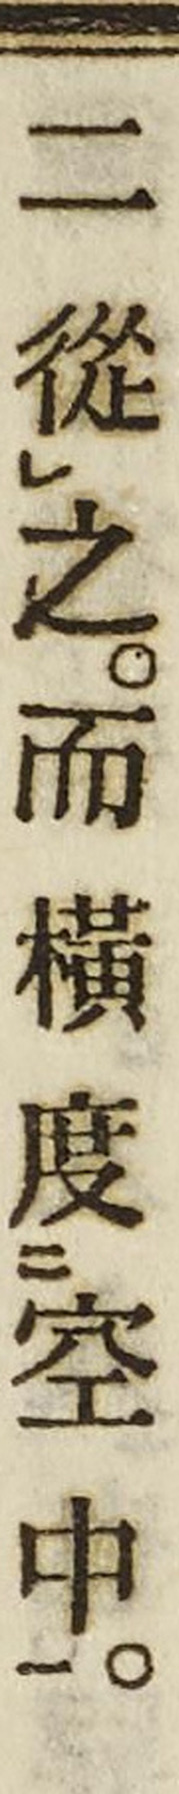二従之。而横度ニ空中。
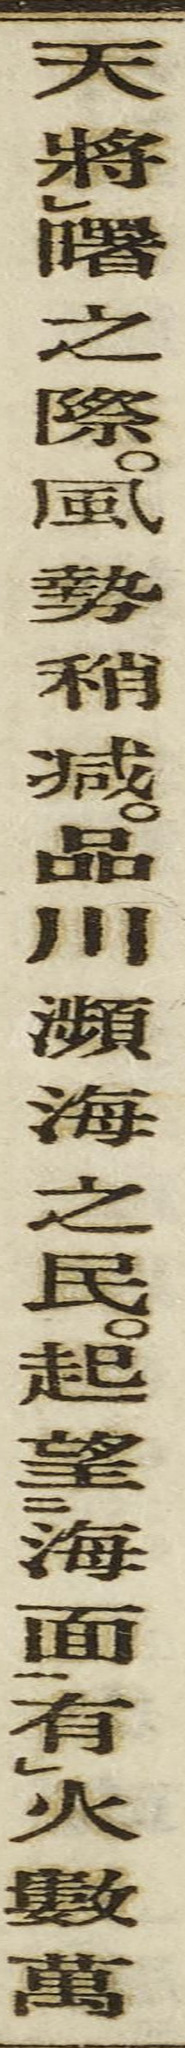天将曙之際。風勢稍減。品川瀕海之民。起望ニ海面有火数万
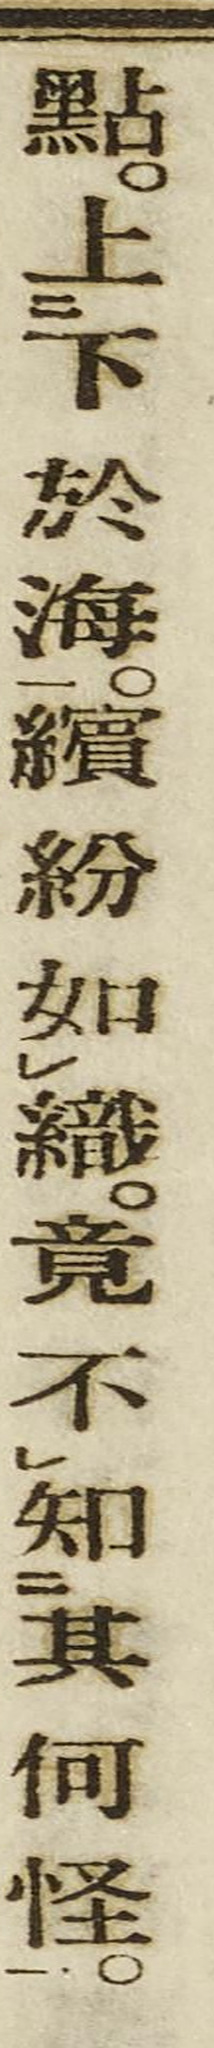点。上ニ下於海。繽紛如織。竟不知ニ其何怪。

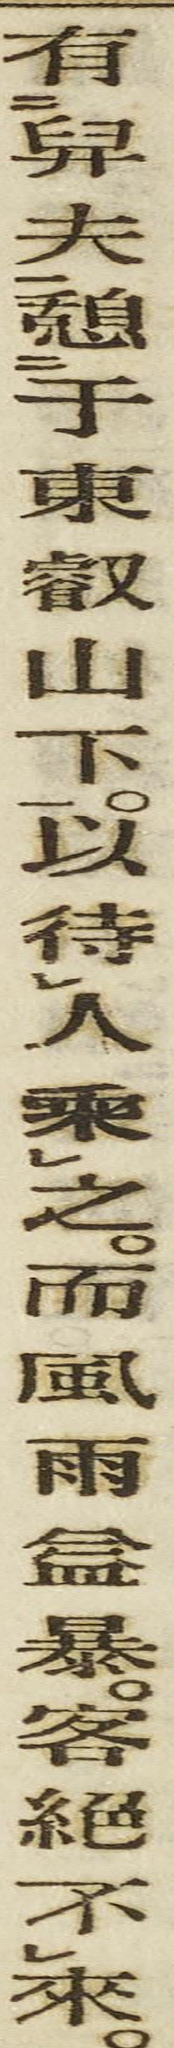有ニ舁夫憩ニ于東叡山下。以待人乗之。而風雨益暴。客絶不来。
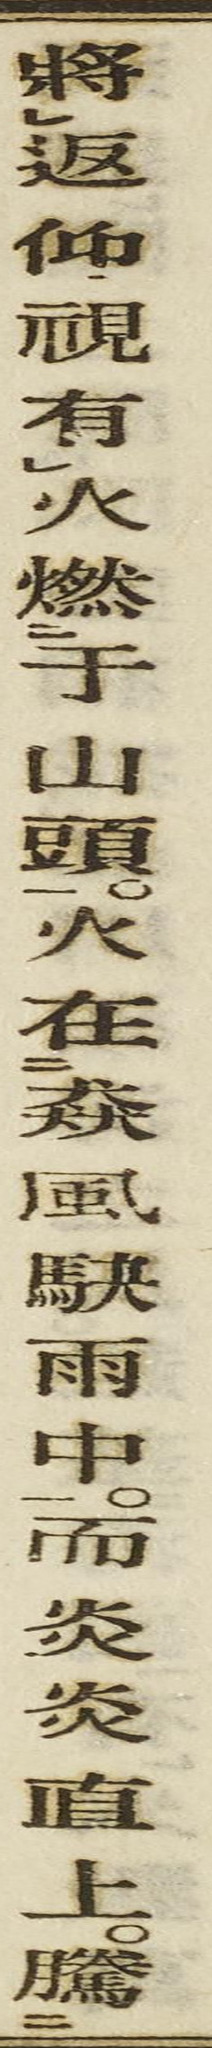将返仰視有火燃ニ于山頭。火在ニ猋風駃雨中。而炎炎直上。騰ニ
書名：史籍集覽　朝鮮陣古文・細井廣澤記・颶風紀事・天明七年將軍宣下次第書　全
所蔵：東京大学地震研究所図書室 Earthquake Research Institute Library, The University of Tokyo, JAPAN
